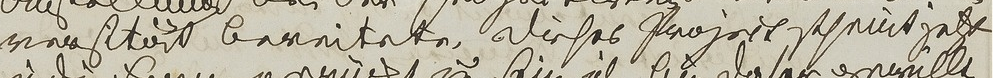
versität bereitete, dieses Projekt scheint jetzt
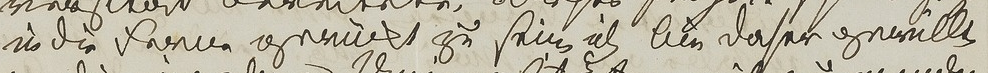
in die Ferne gerückt zu sein, ich bin daher gewillt,
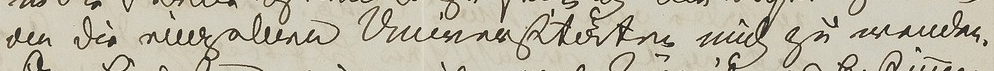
an die einzelnen Universitäten mich zu wenden.
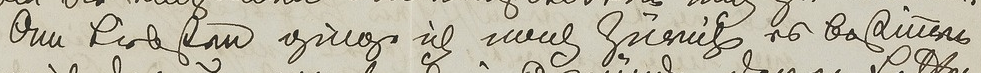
Am Liebsten ginge ich nach Zürich, es bestimmen
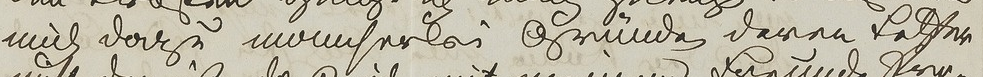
mich dazu mancherlei Gründe, deren Letzter
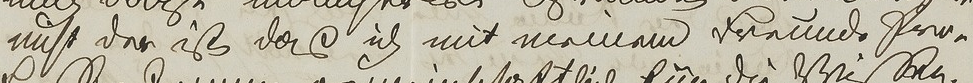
nicht der ist, daß ich mit meinem Freunde Pro-
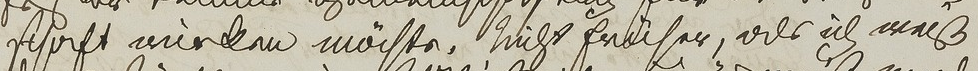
schaft wirken möchte. Nicht früher, als ich weiß,
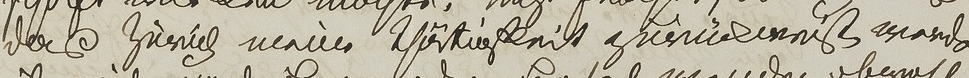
daß Zürich meine Thätigkeit zurückweist, werde
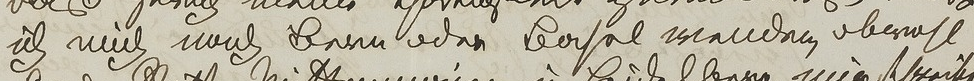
ich mich nach Bern oder Basel wenden, obwohl
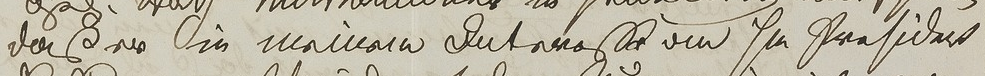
daß er in meinem Interesse an Hr President
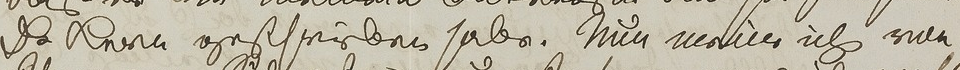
Dr Kern geschrieben habe. Nun meine ich, von
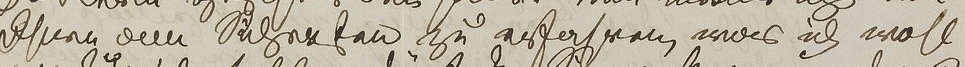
Ihnen am Sichersten zu erfahren, was ich wohl
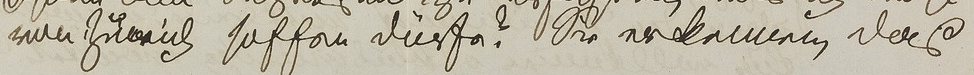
von Zürich hoffen dürfte? Sie erkennen, daß
